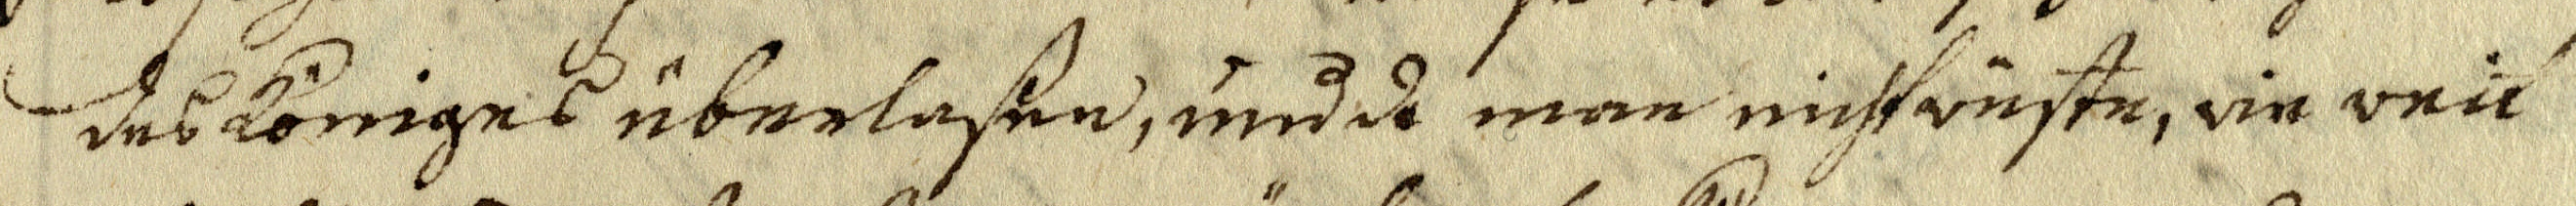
des Königes überlaßen, und da man nicht wüste, wie weit
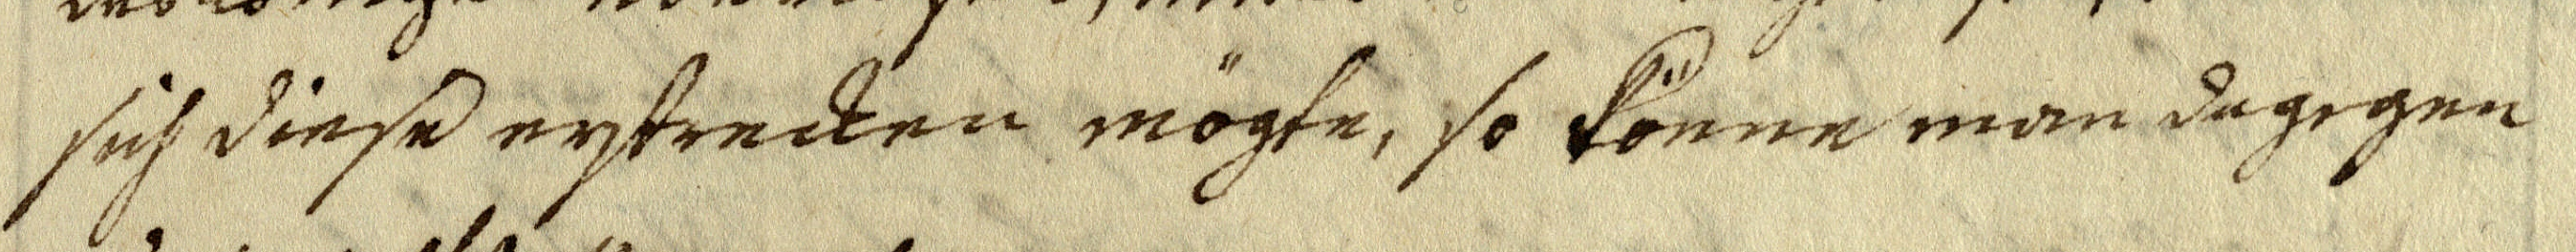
sich diese erstrecken mögte, so könne man dagegen
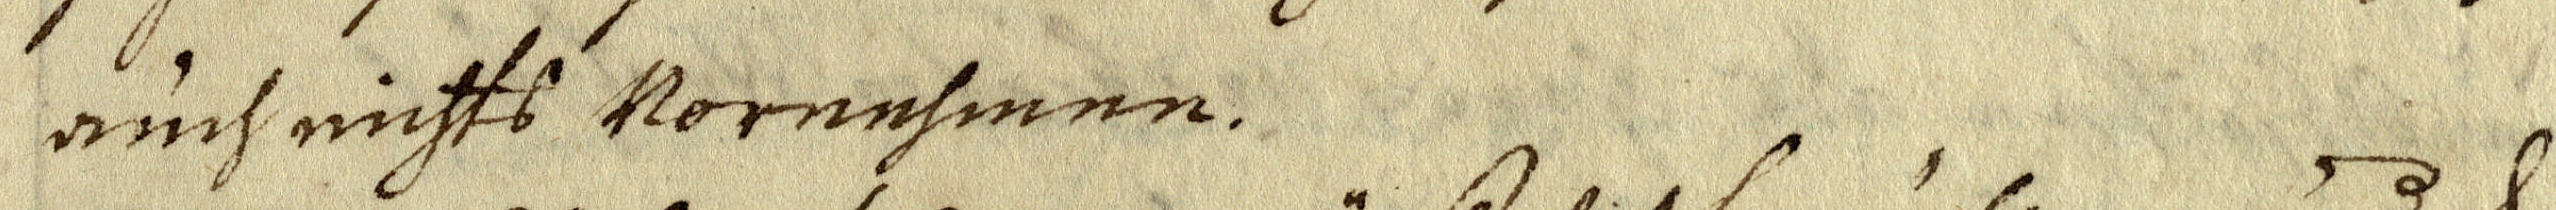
auch nichts vornehmen.
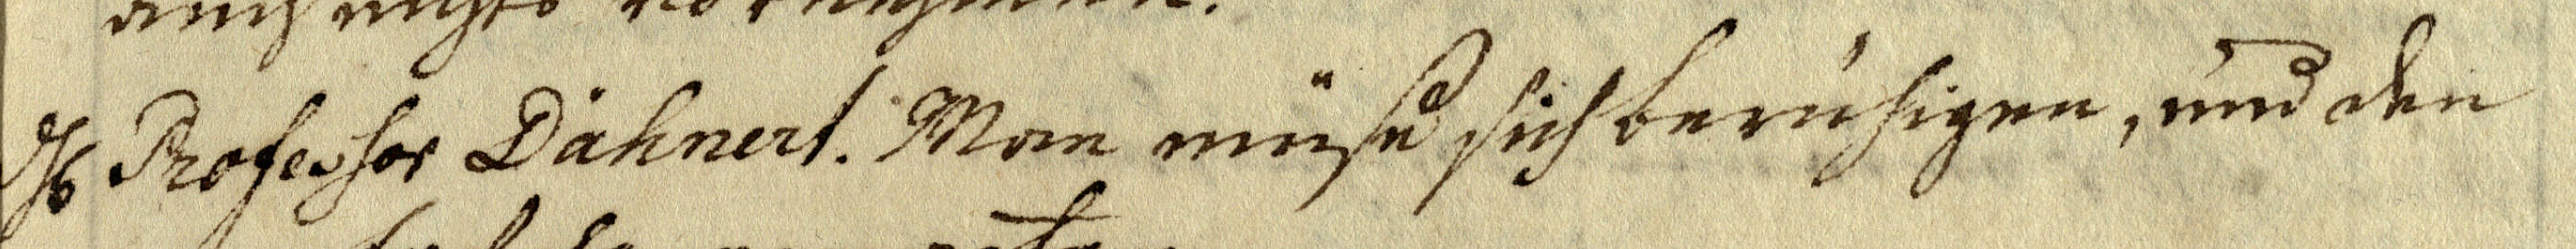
dh Professor Dähnert. Man müße sich beruhigen, und den
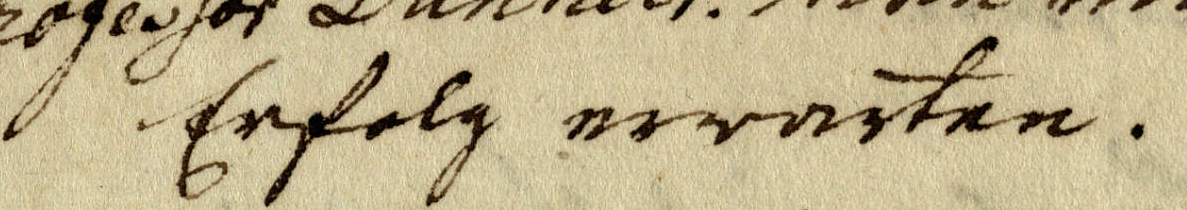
Erfolg erwarten.
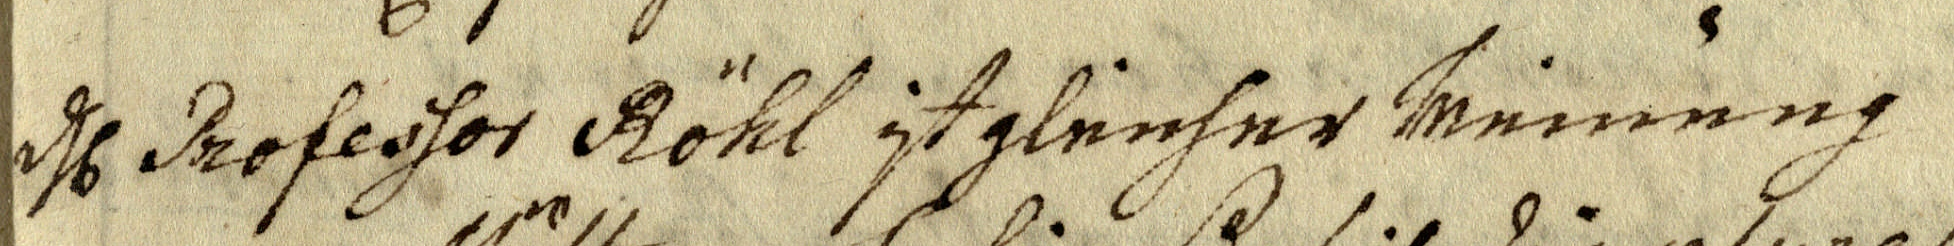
dh Professor Röhl ist gleicher Meinung.
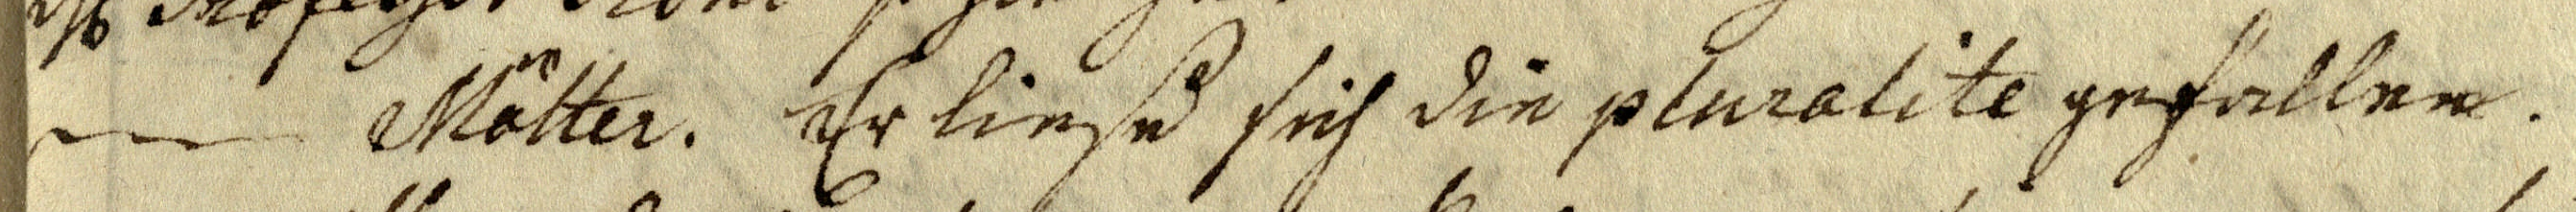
Möller. Er ließe sich die pluralite gefallen.
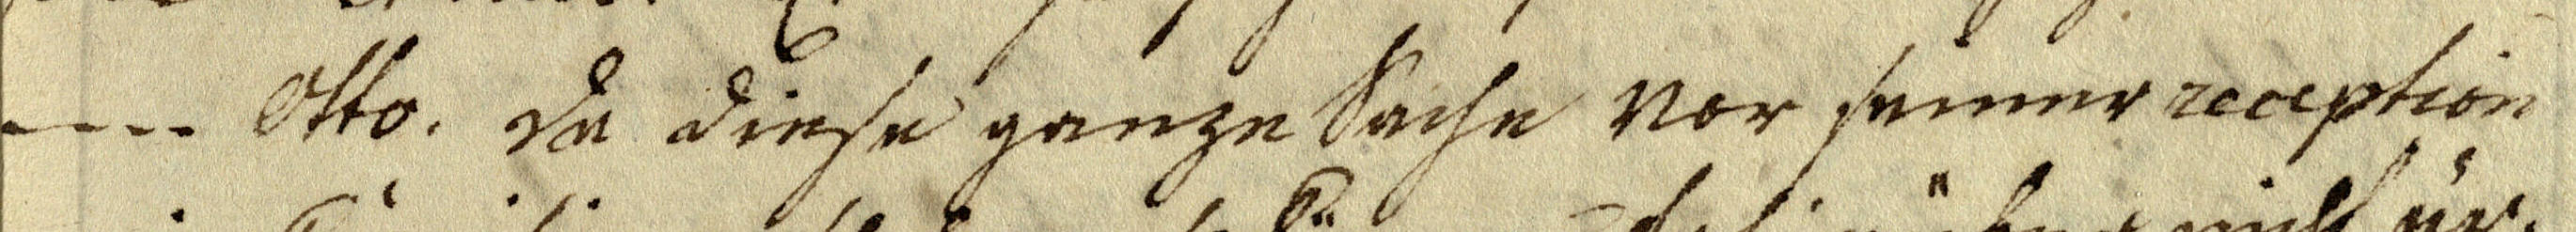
Otto. Da diese ganze Sache vor seiner reception
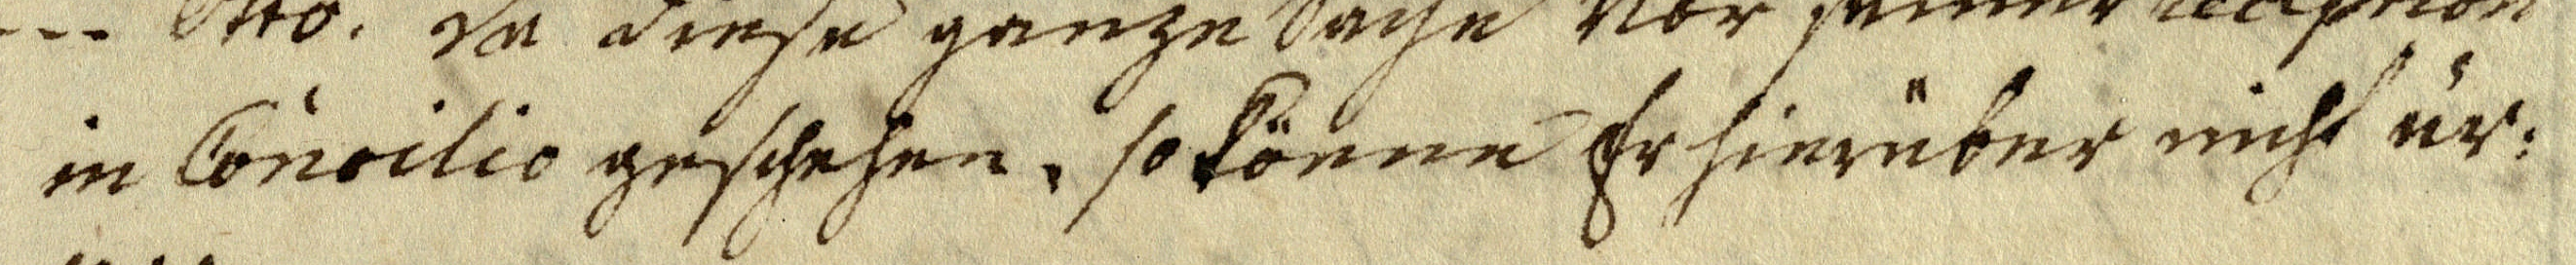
in Concilio geschehen, so könne Er hierüber nicht ur¬
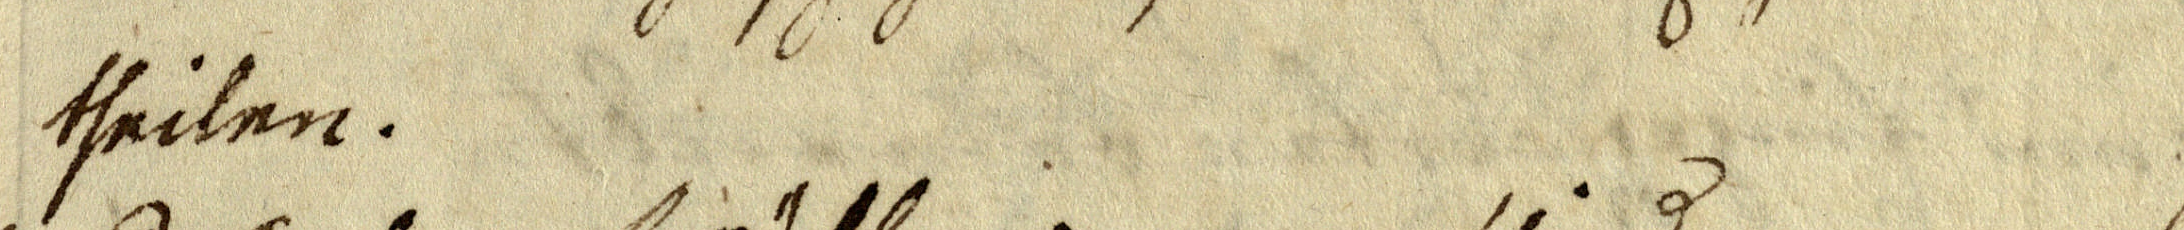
theilen.
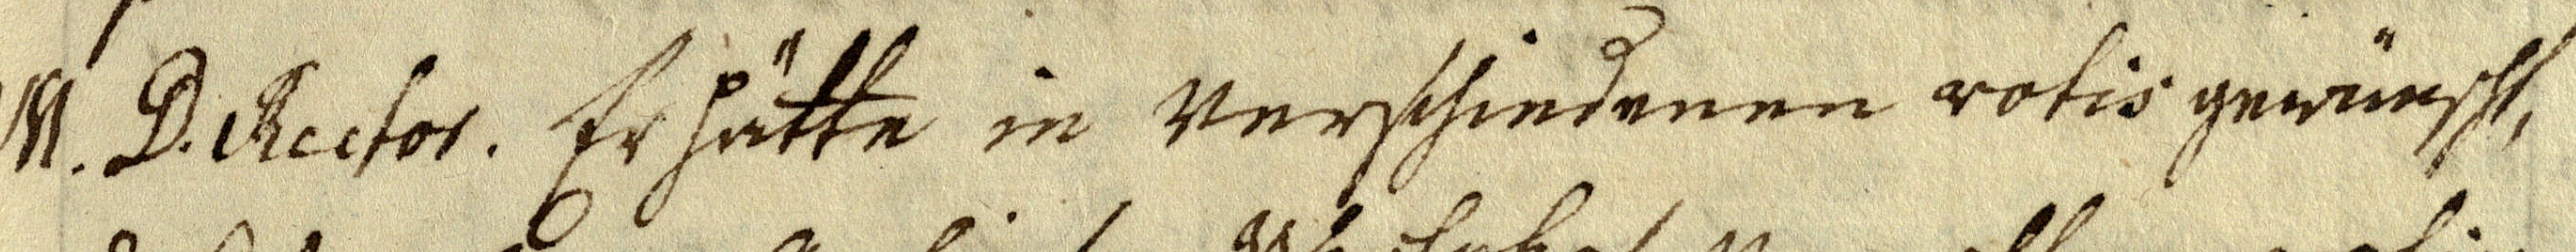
M. D. Rector. Er hätte in verschiedenen votis gewünscht,
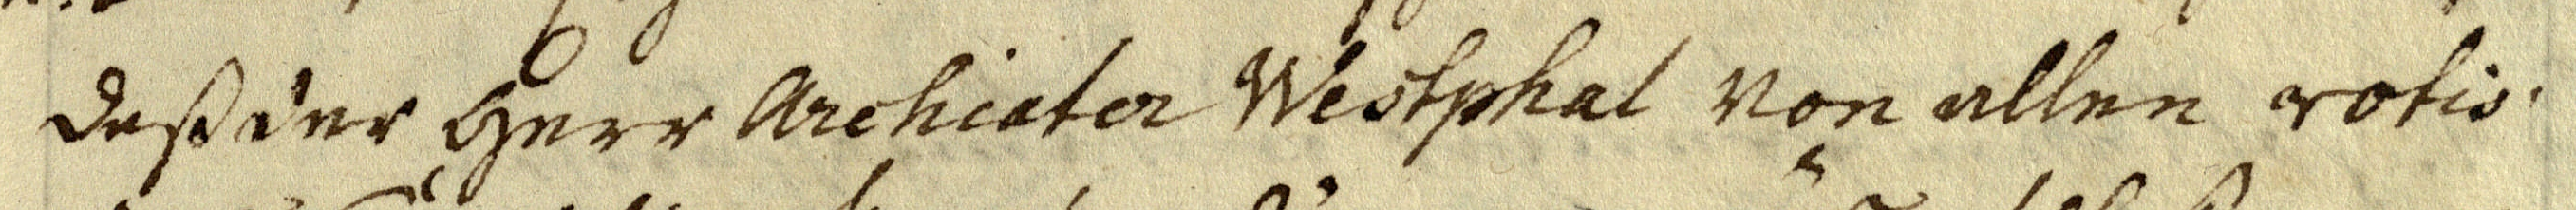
daß der Herr Archiater Westphal von allen votis
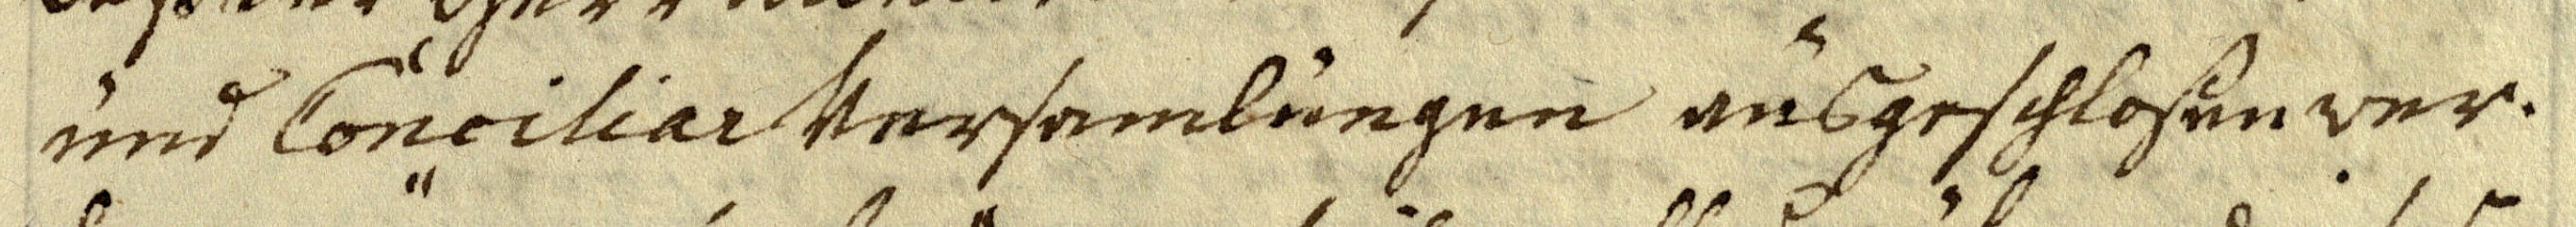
und ConciliarVersamlungen ausgeschloßen wer¬
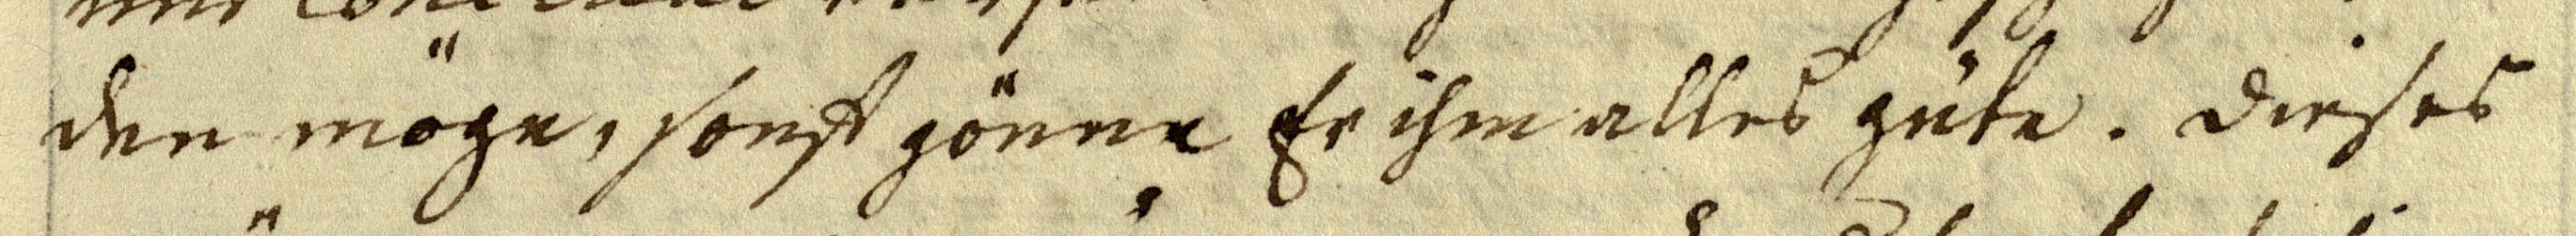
den möge, sonst gönne Er ihm alles Gute. Dieses
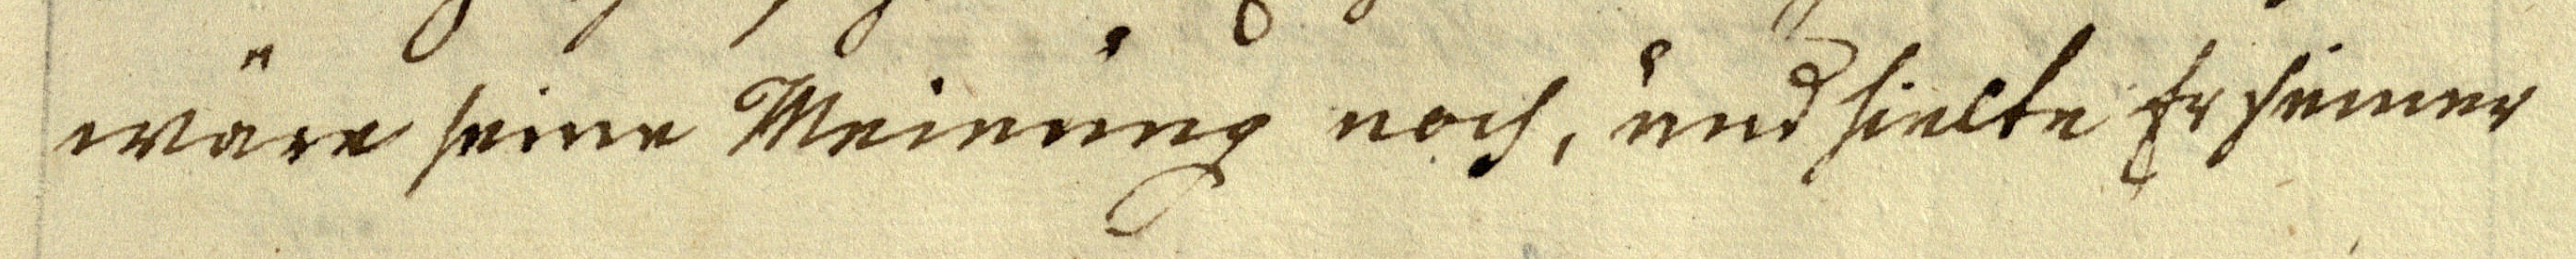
wäre seine Meinung noch, und hielte Er seiner
